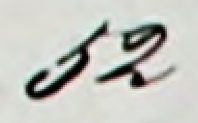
52
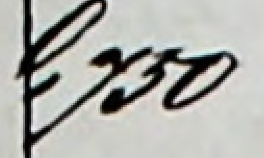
0,750
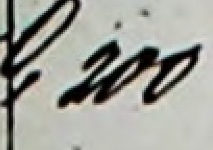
0,200
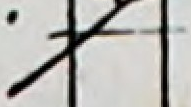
7
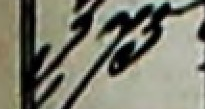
3,75
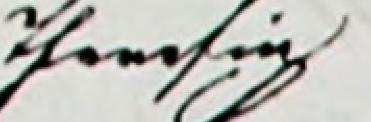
Theresia
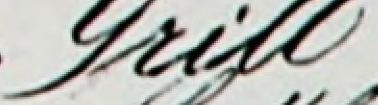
Grill
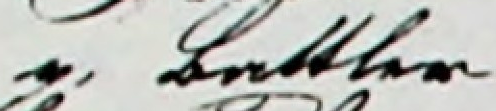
v. Battler
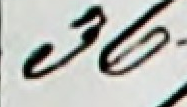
36
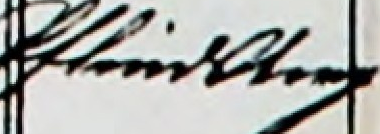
Pflindsberg
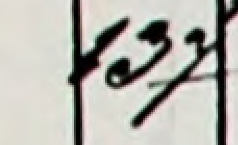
137
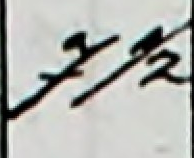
7 1/2
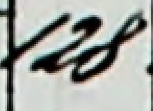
128
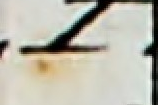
I
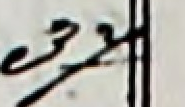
37
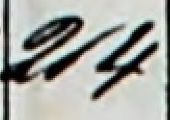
214
